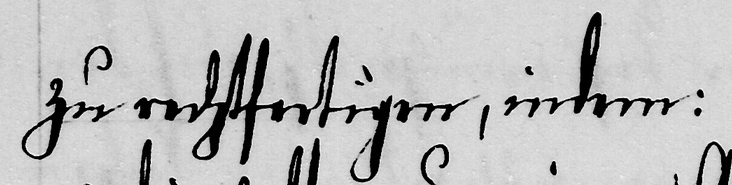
zu rechtfertigen, indem:
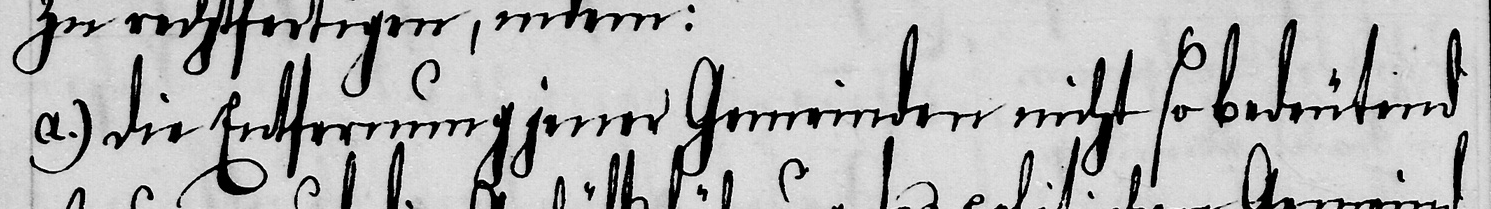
a.) die Entfernung jener Gemeinden nicht so bedeutend
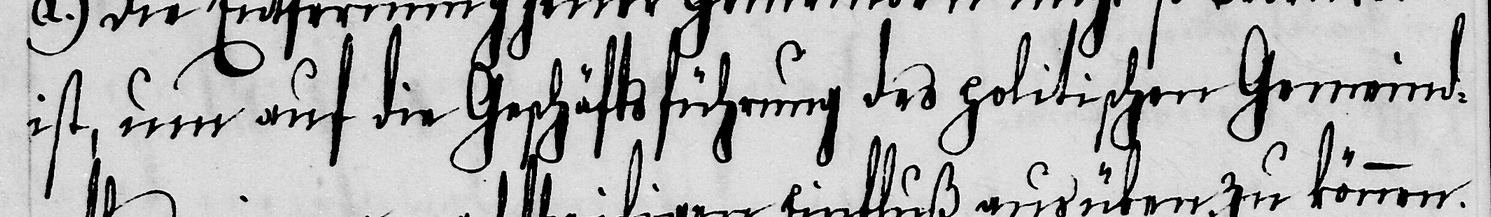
ist, um auf die Geschäftsführung des politischen Gemeind¬
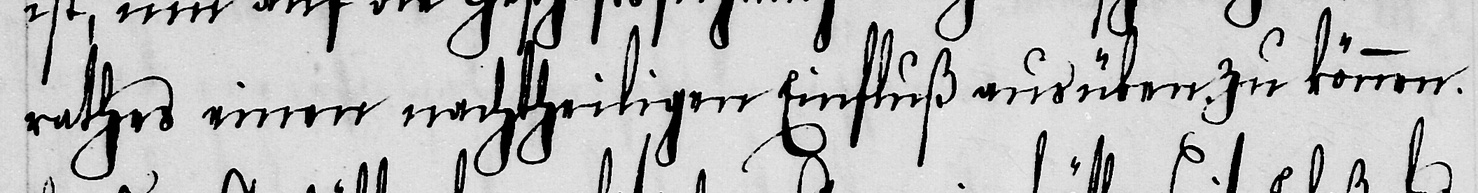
rathes einen nachtheiligen Einfluß ausüben zu können.
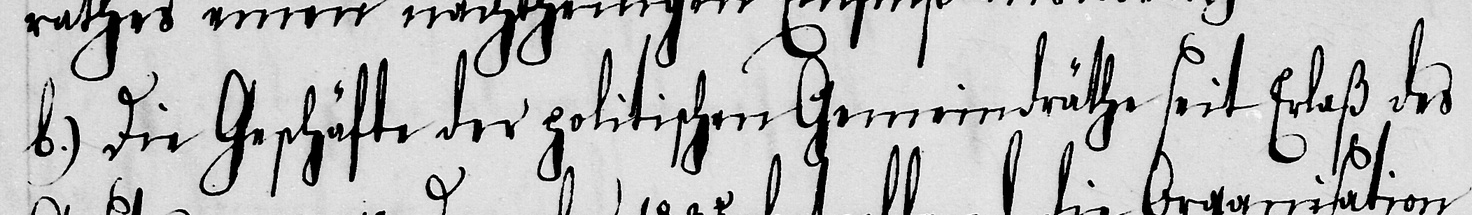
b.) Die Geschäfte der politischen Gemeindräthe seit Erlaß des
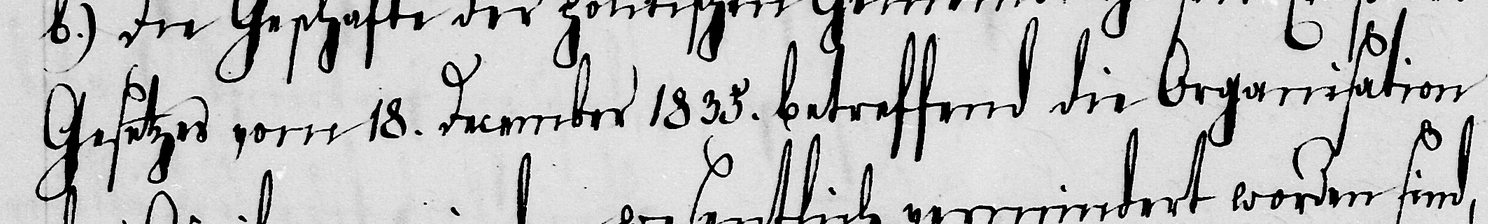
Gesetzes vom 18. December 1835. betreffend die Organisation
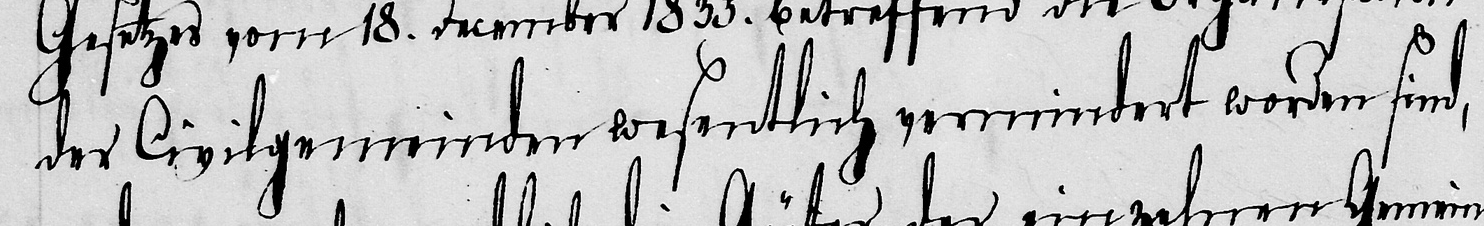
der Civilgemeinden wesentlich vermindert worden sind,
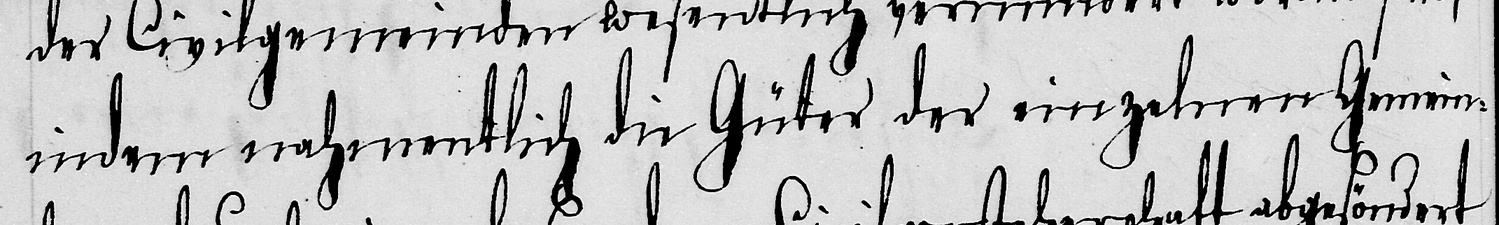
indem namentlich die Güter der einzelnen Gemein¬
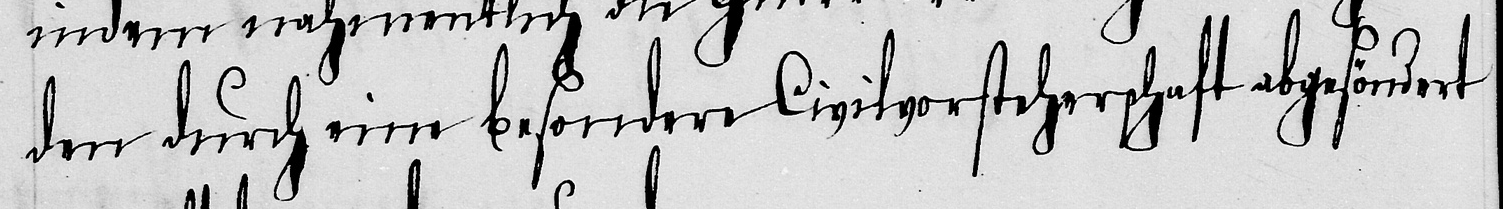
den durch eine besondere Civilvorsteherschaft abgesöndert
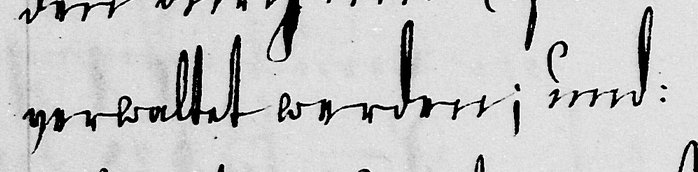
verwaltet werden; und:
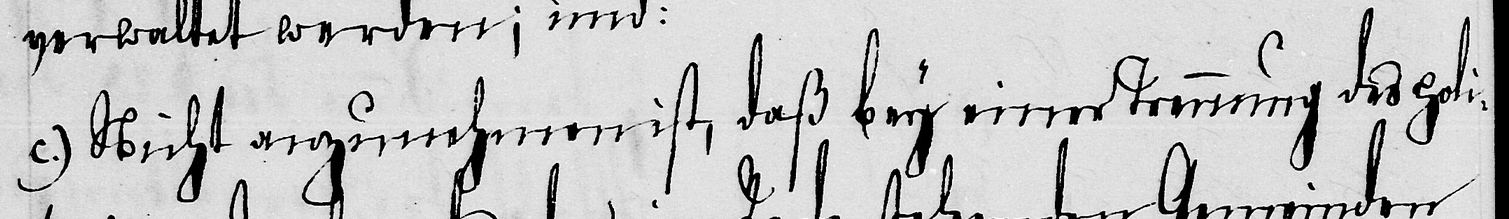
c.) Nicht anzunehmen ist, daß bey einer Trennung des poli¬
